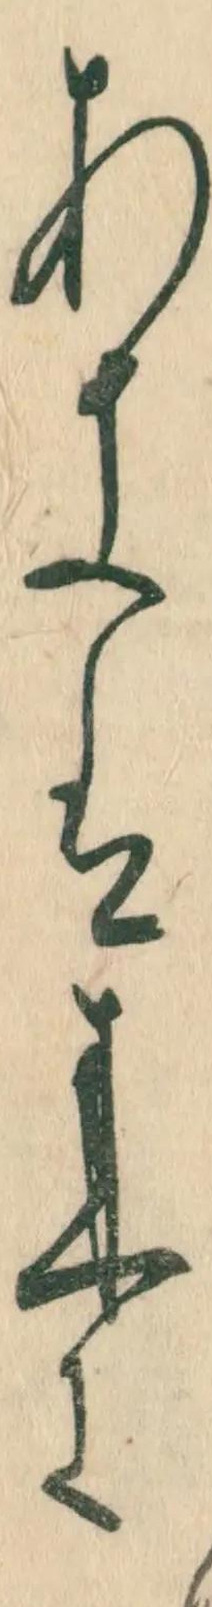あきは来に
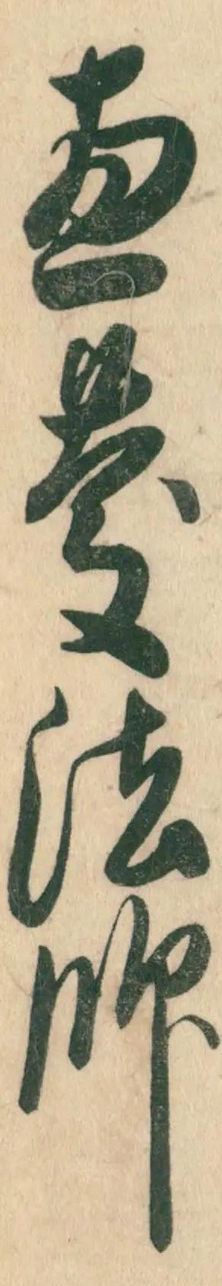恵慶法師

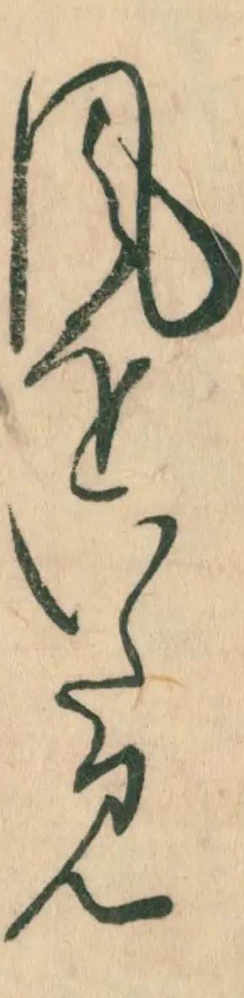風をいたみ
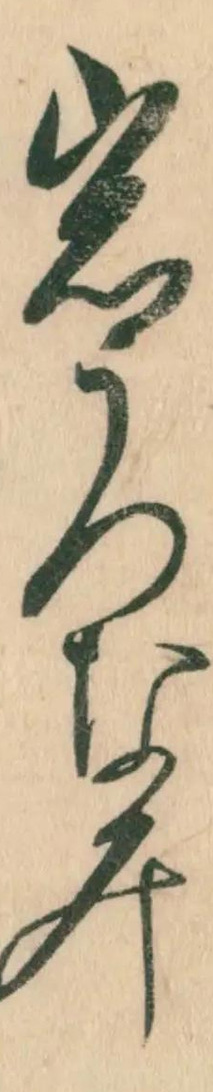岩うつなみ
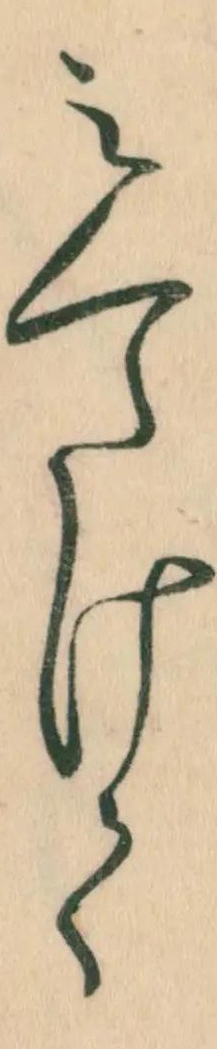みくたけて
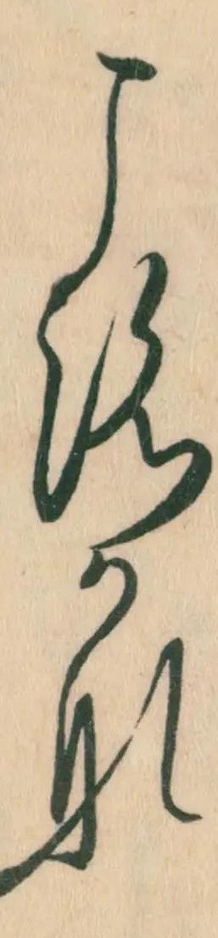ころかな
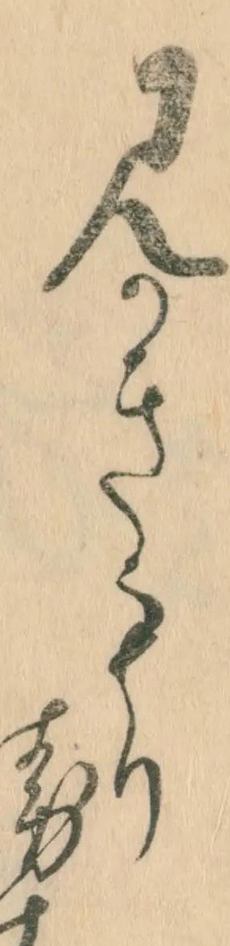見かきもり
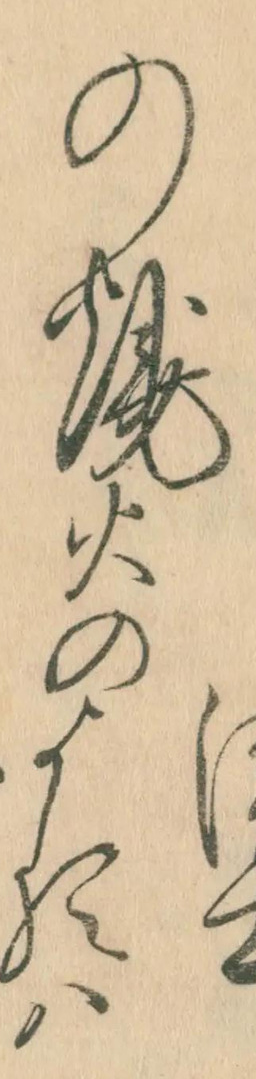の焼火のよるは
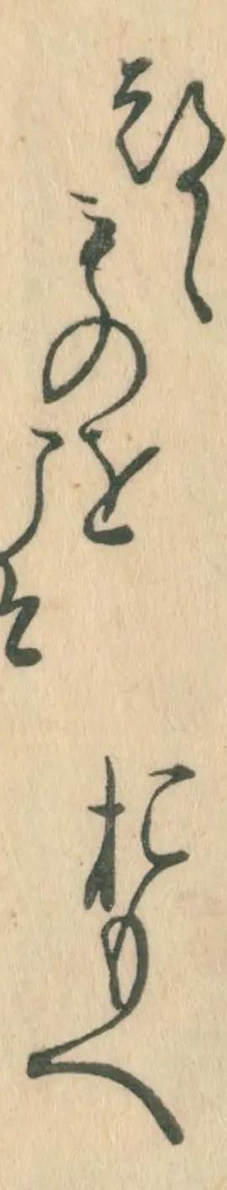ものをおもへ
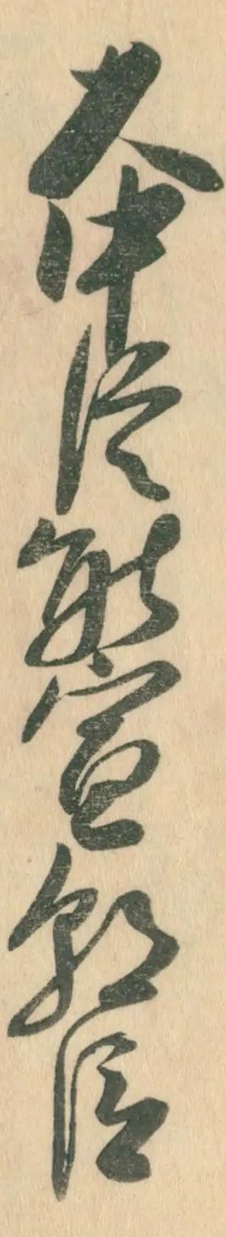大中臣能宣朝臣

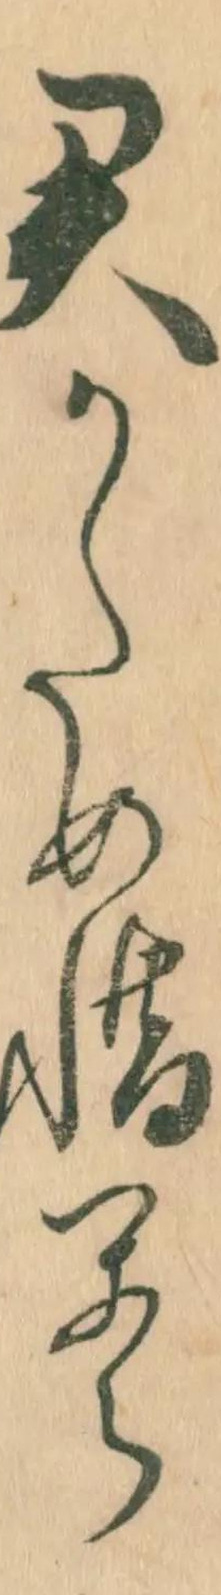君かため惜から
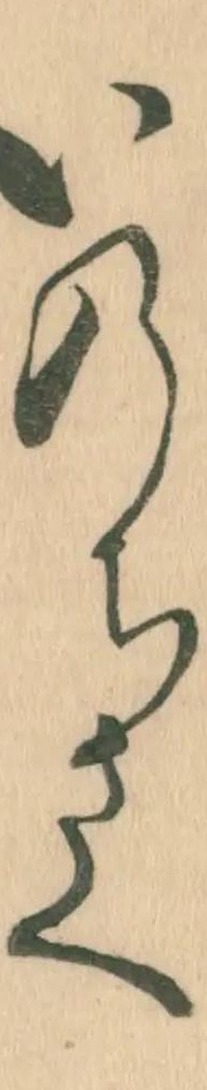いのちさへ
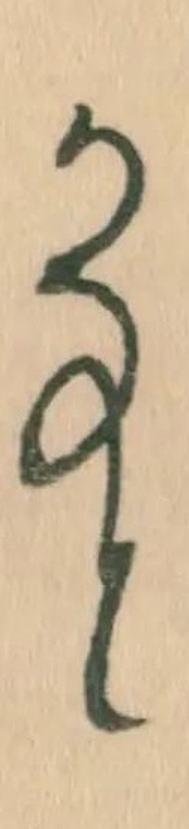かなと
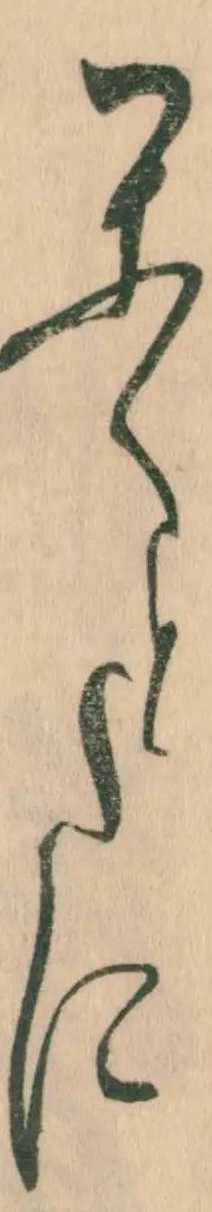かくとたに
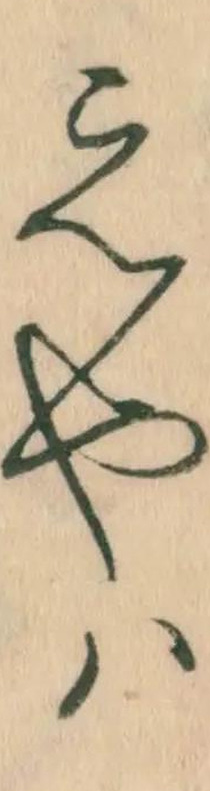えやは
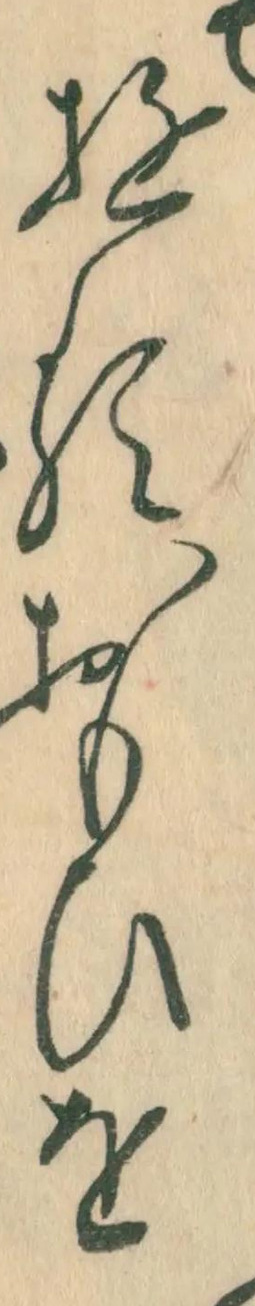もゆるおもひを
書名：錦百人一首あつま織
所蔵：国立国会図書館 National Diet Library, JAPAN
